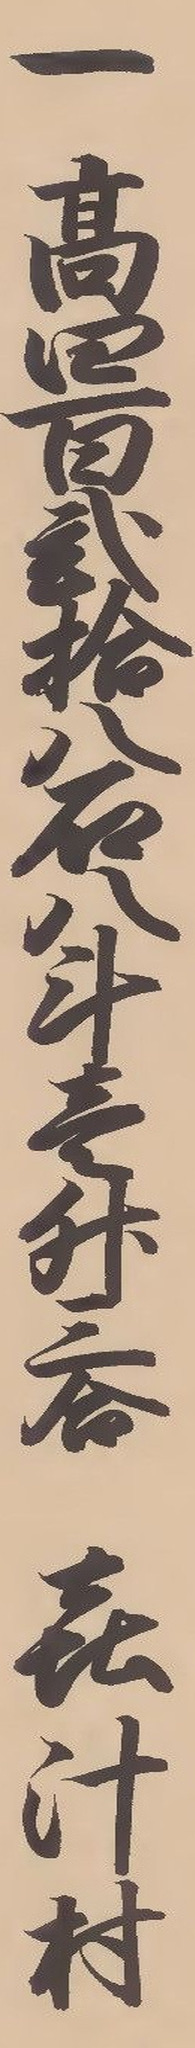一髙四百弐拾八石八斗壱升三合喜汁村
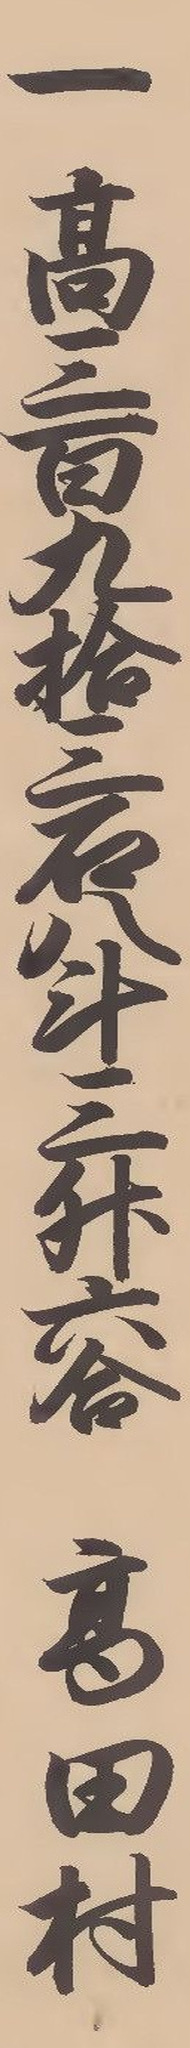一髙三百九拾三石八斗三升六合髙田村
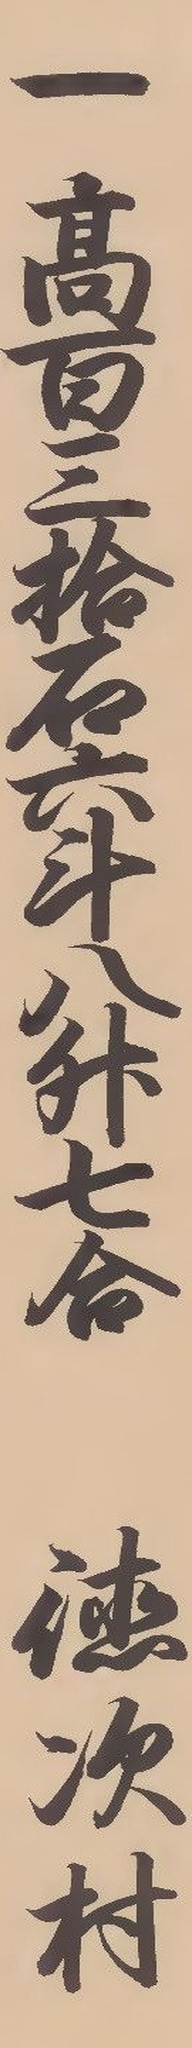一髙百三拾石六斗八升七合徳次村
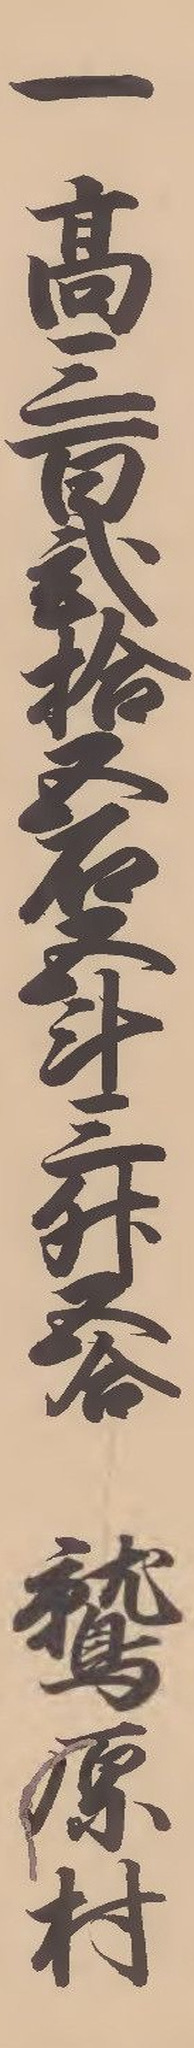一髙三百弐拾五石五斗三升五合鷲原村

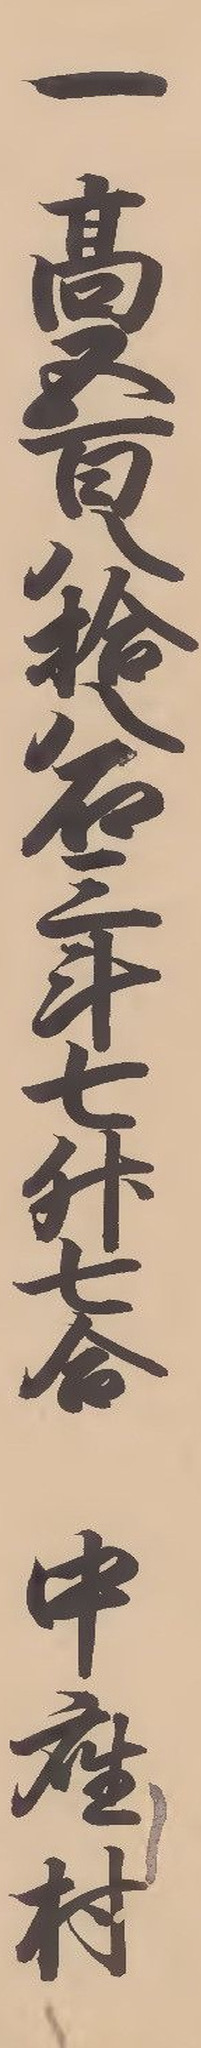一髙五百八拾八石三斗七升七合中座村
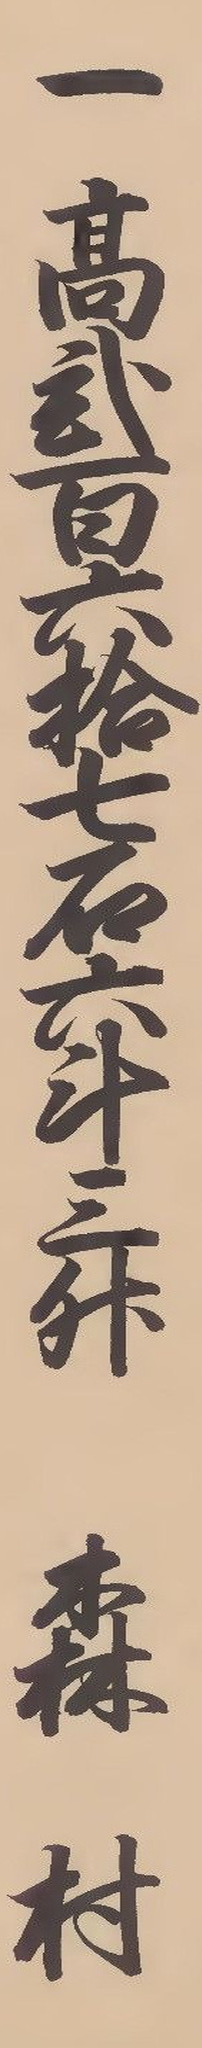一髙弐百六拾七石六斗三升森村
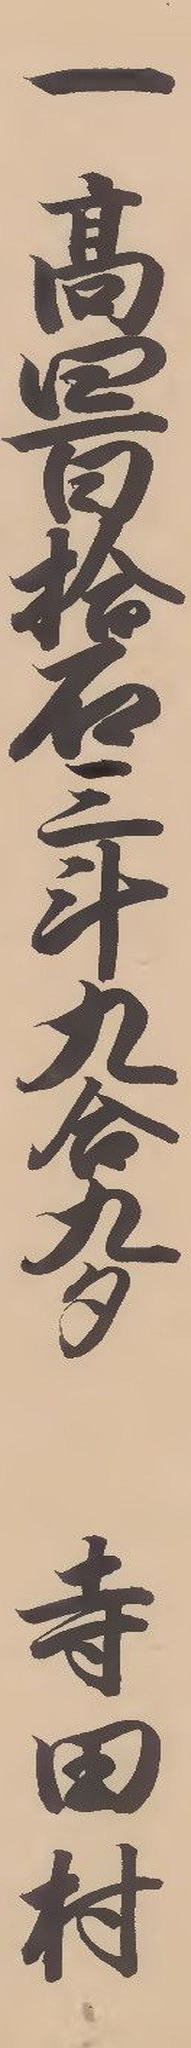一髙四百拾石三斗九合九夕寺田村
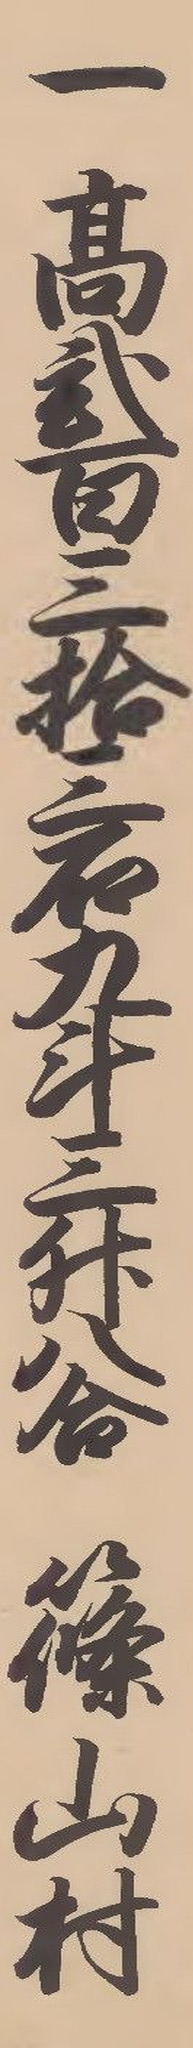一髙弐百三拾三石九斗三升八合篠山村
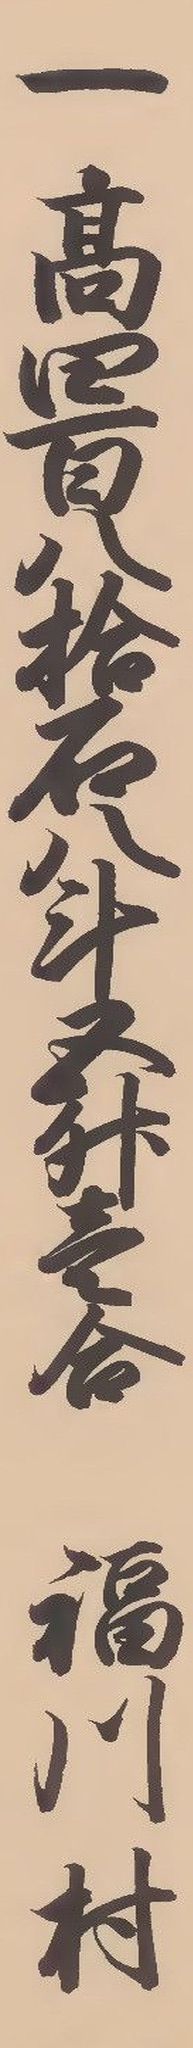一高四百八拾石八斗五升壱合福川村
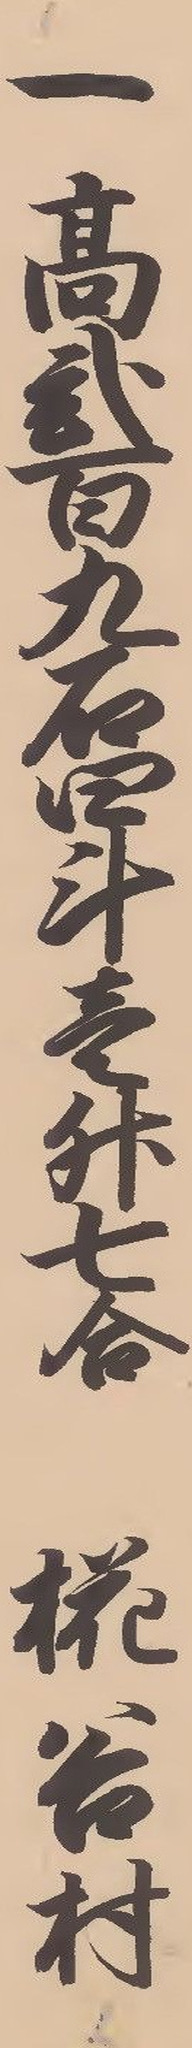一髙弐百九石四斗壱升七合椛谷村
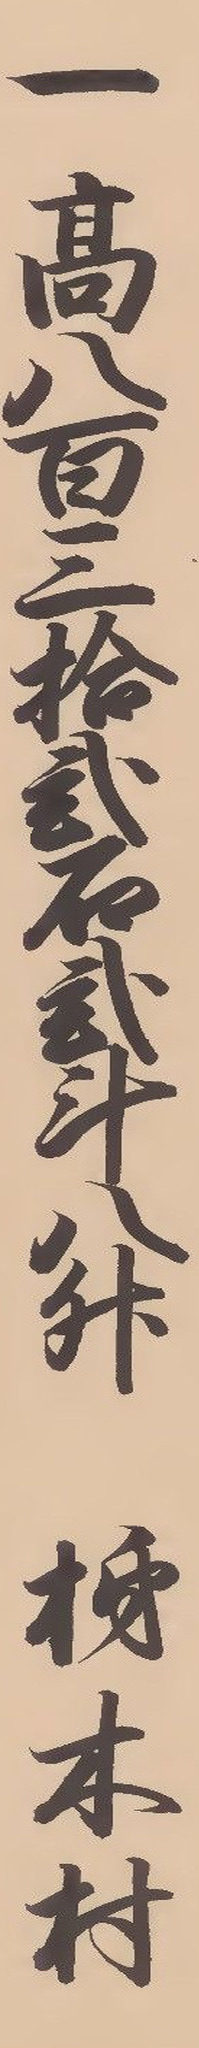一髙八百三拾弐石弐斗八升柿木村
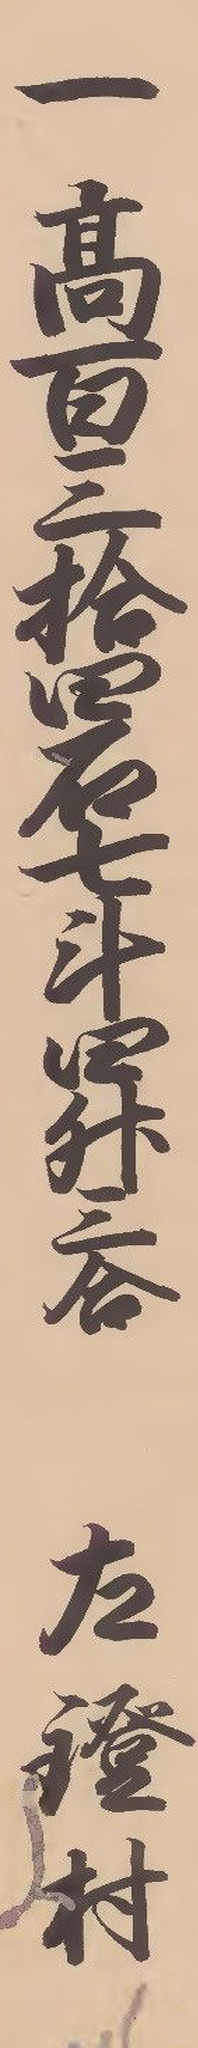一髙百三拾四石七斗四升三合左鐙村

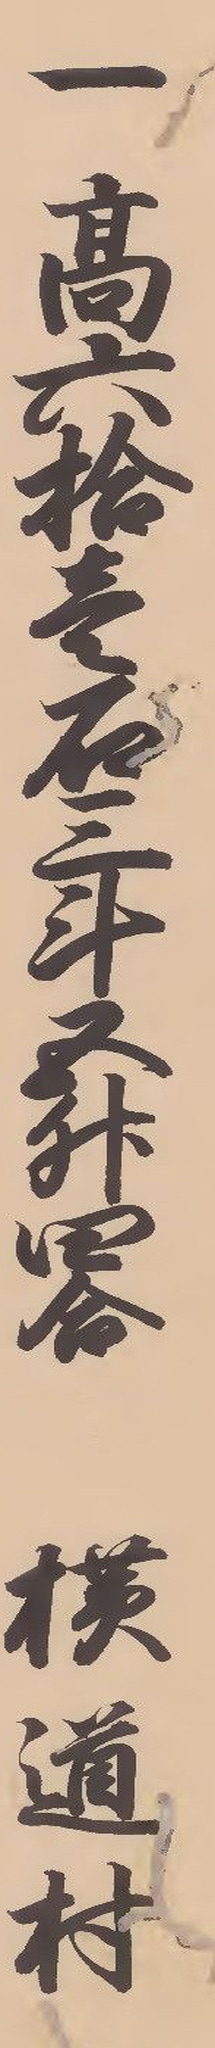一髙六拾壱石三斗五升四合横道村
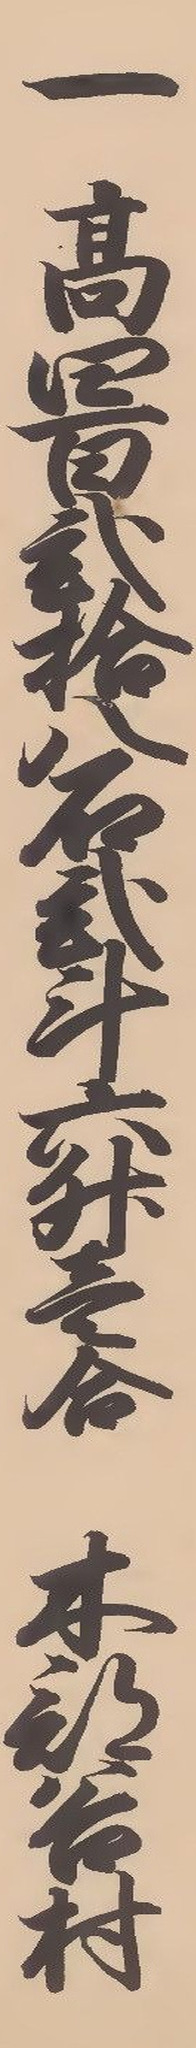一髙四百弐拾八石弐斗六升壱合木部谷村
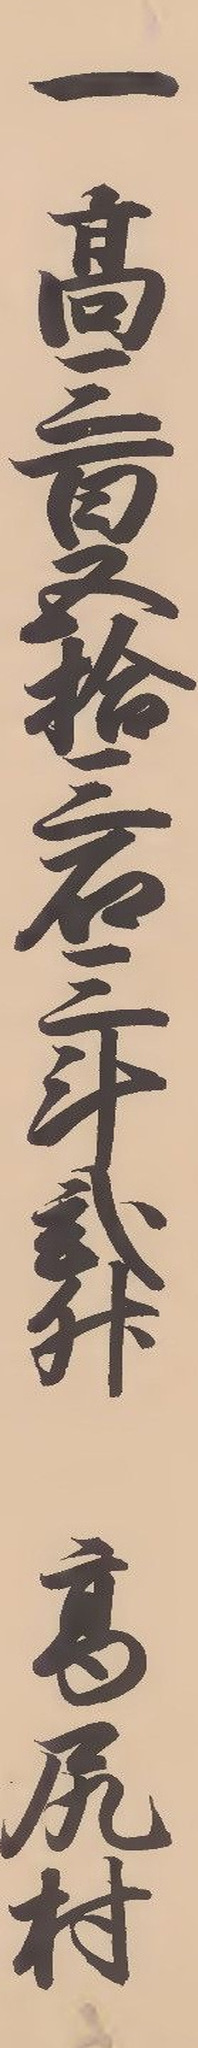一髙三百五拾三石三斗弐升髙尻村
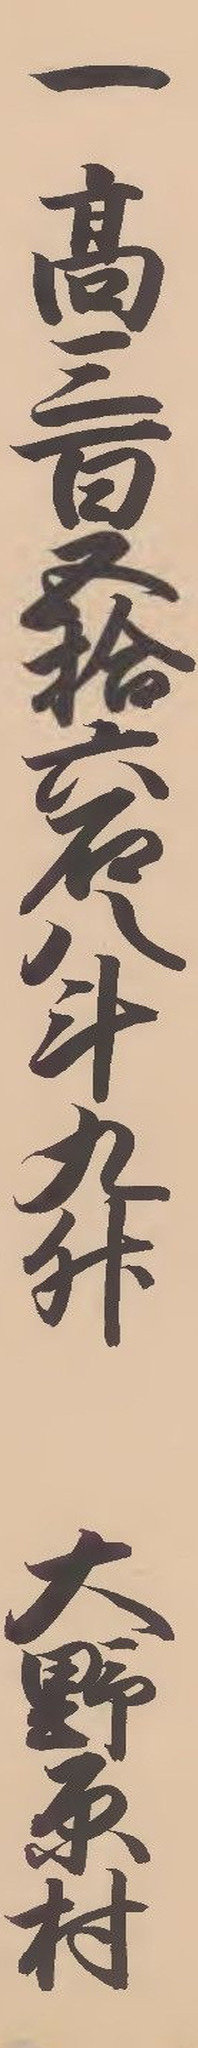一髙三百五拾六石八斗九升大野原村
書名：石見国郷帳
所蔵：国立公文書館 National Archives of Japan
